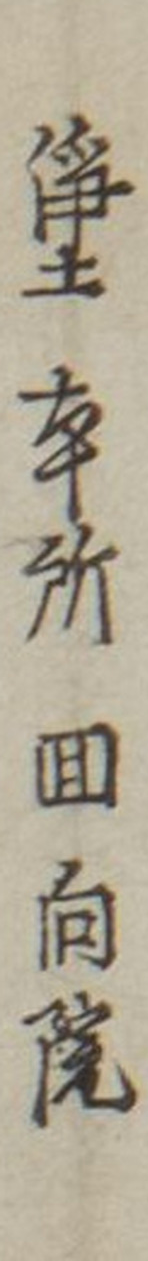浄土本所回向院
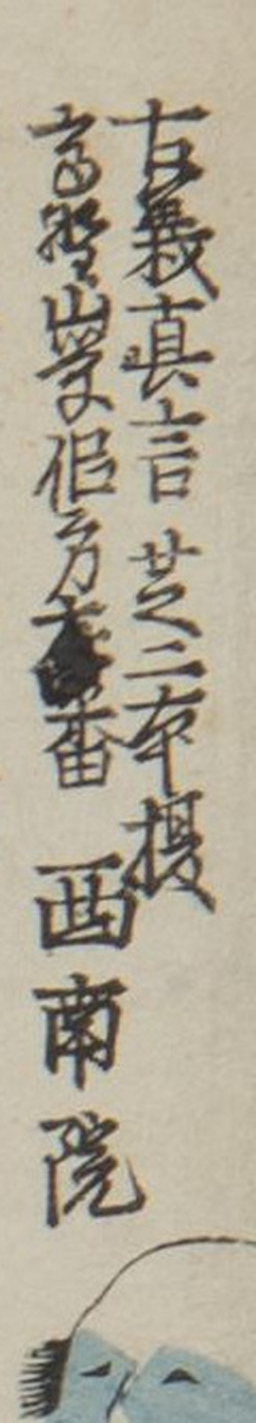高野山学侶方番西南院
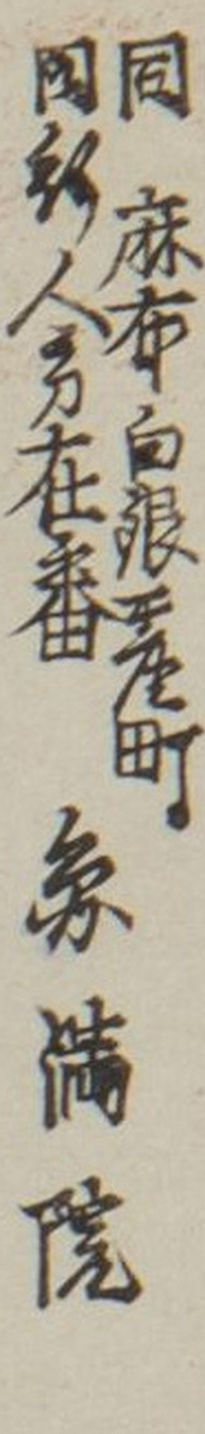同行人方在番円満院
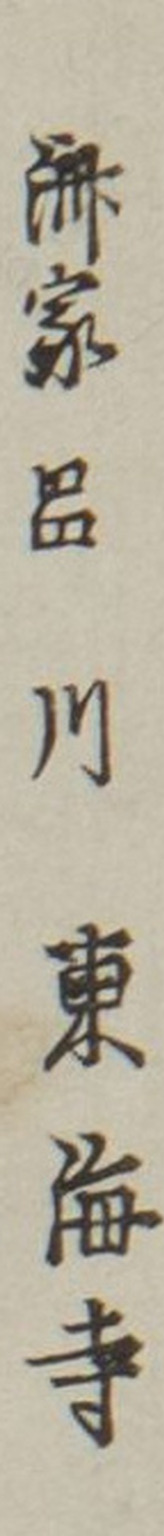済家品川東海寺
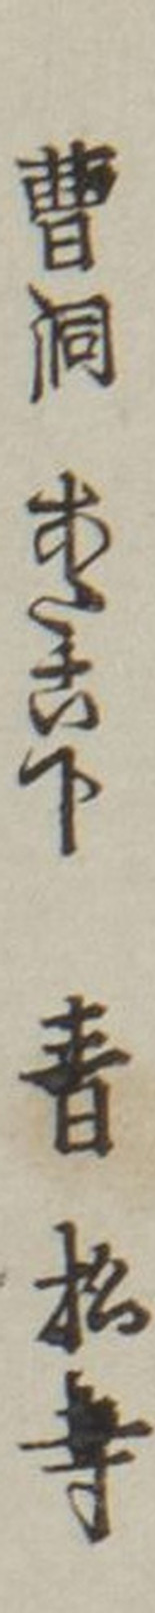曹洞あたこ下青松寺
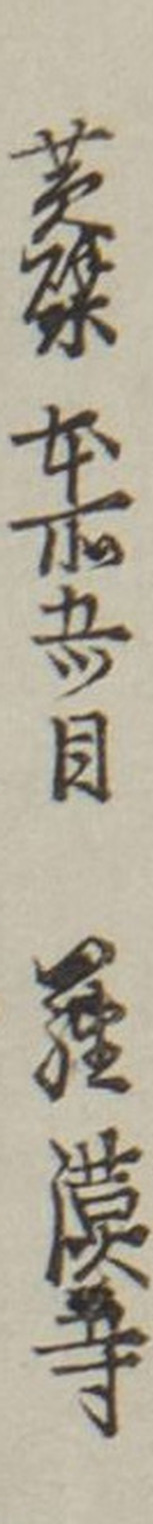黄檗本所五ツ目羅漢寺
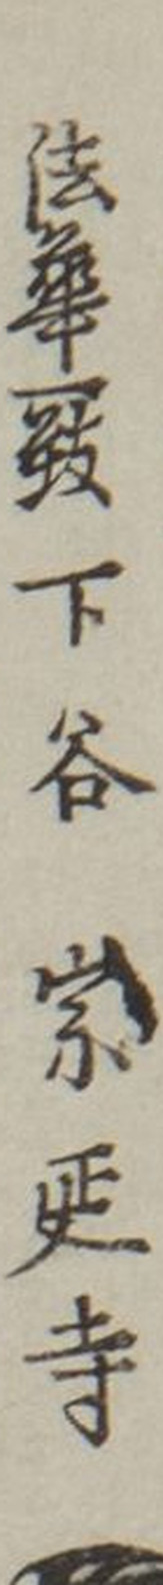法華一致下谷宗延寺
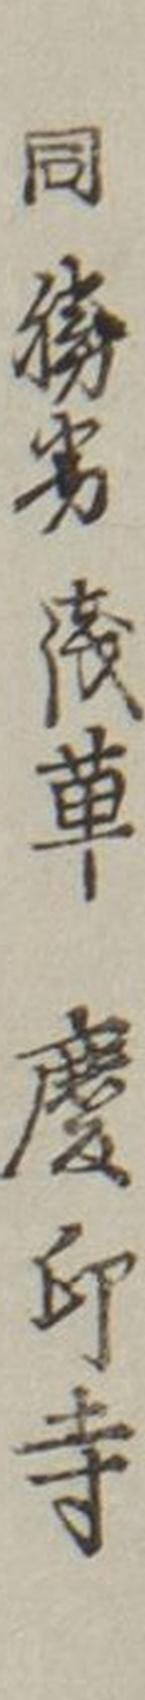同勝劣浅草慶印寺
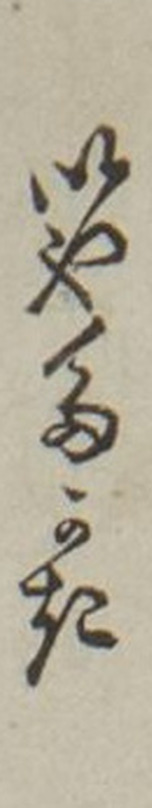いやたかき
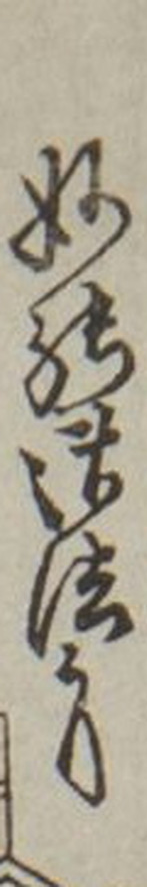妙の御法に
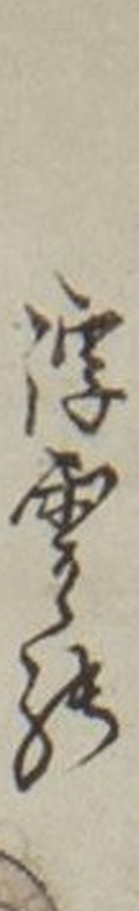浮雲の
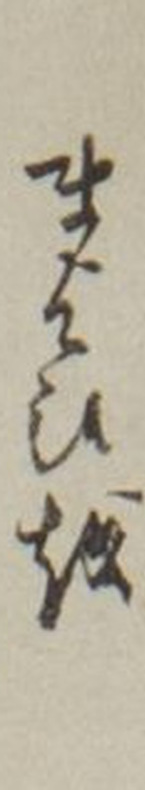まよひを
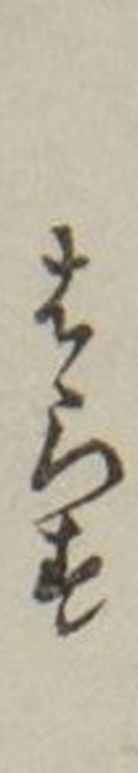はらす
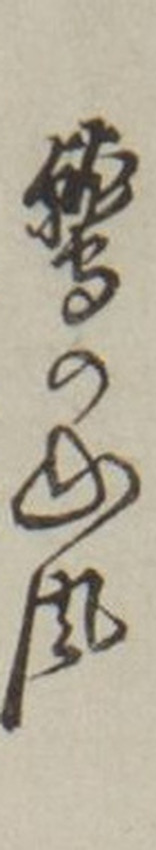鷲の山風
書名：江戸地震施餓鬼の図
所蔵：あいおいニッセイ同和損保株式会社
